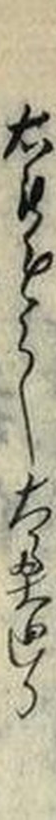右被進之大奥廻り
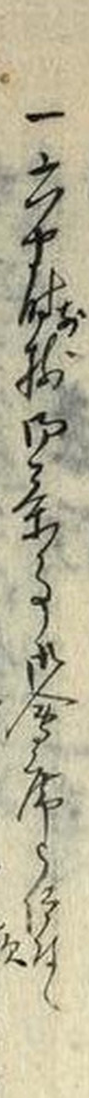一六半時前揃御茶事御会席被仰付候
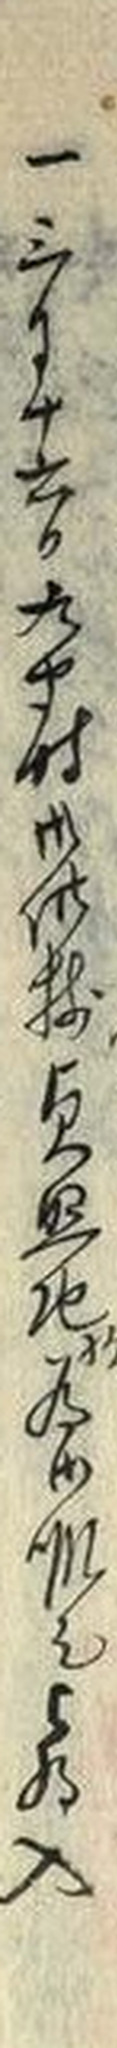一三月十六日九半時御供揃貞照院様為御暇乞被為入
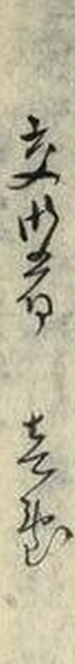交御肴壱台
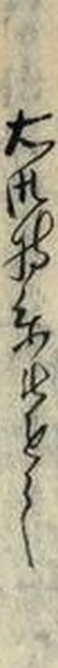右御持参被進之
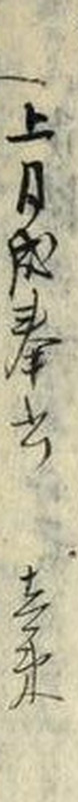上月成奉書壱束
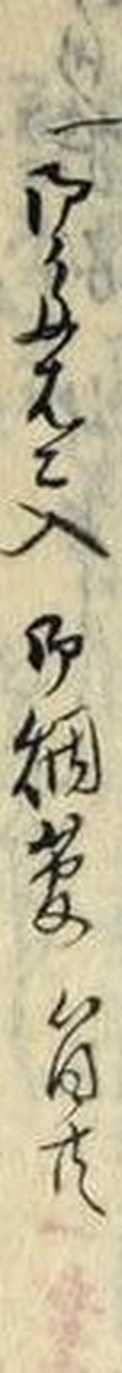御たはこ入御煙管筒共

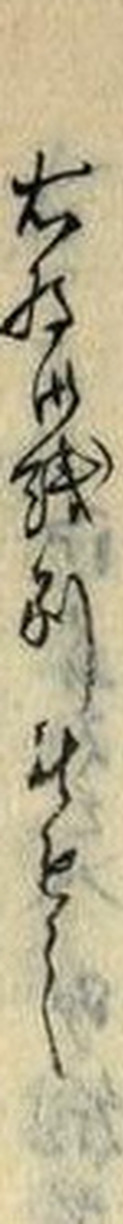右為餞別被進之
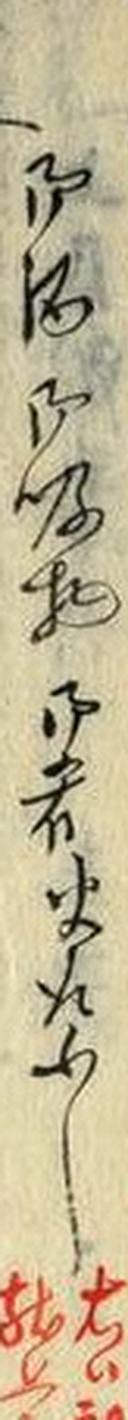御酒御吸物御肴火取ふし
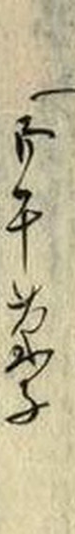御干菓子
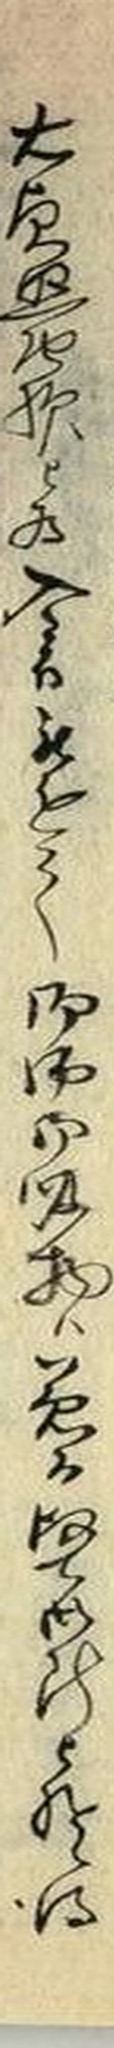右貞照院様被為入候ニ付被進之御酒御吸物ハ兼而堅御断被遊候得
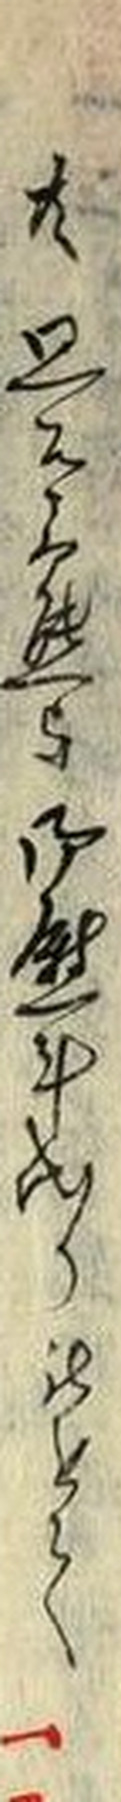共思召ニ而態与御慰斗代り被進之
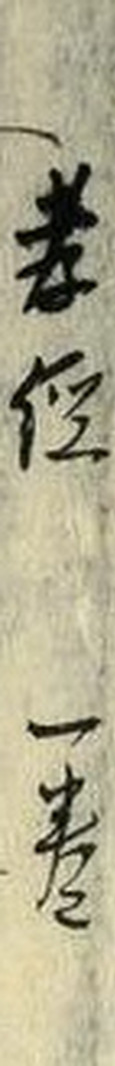孝経一巻
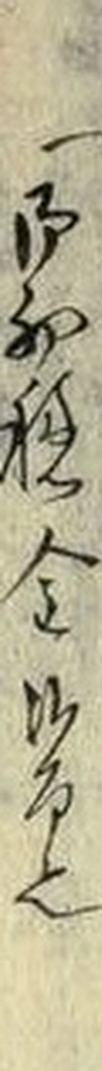御初穂金弐百疋
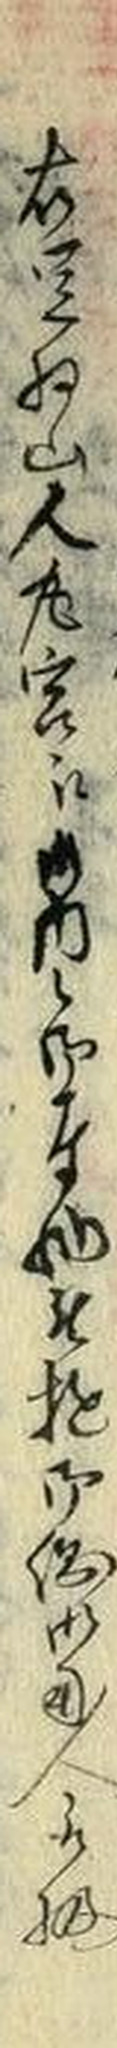右足羽山人丸宮江御内々御奉納被遊御側御用人取扱
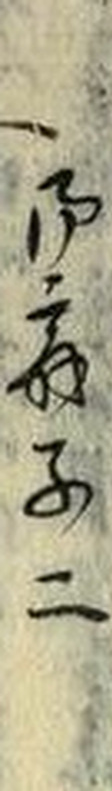御扇子二
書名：少傅日録抄（斉承付側向頭取日記、在国）
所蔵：福井県文書館 Fukui Prefectural Archives
